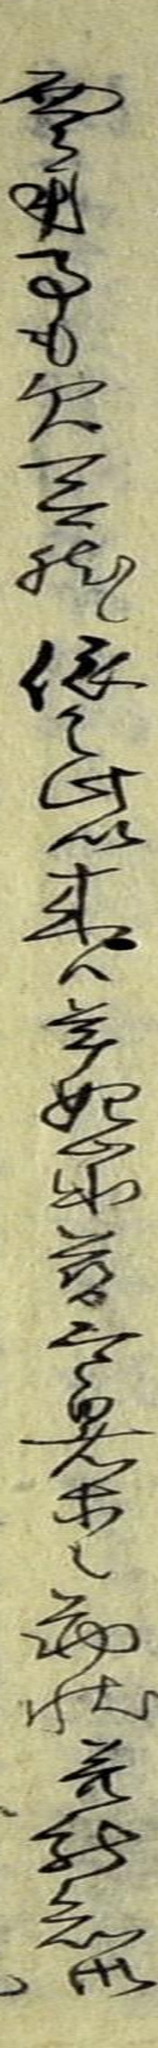面々用事も欠然候依之此以来ハ年始歳暮寒暑等之勤状并新知御
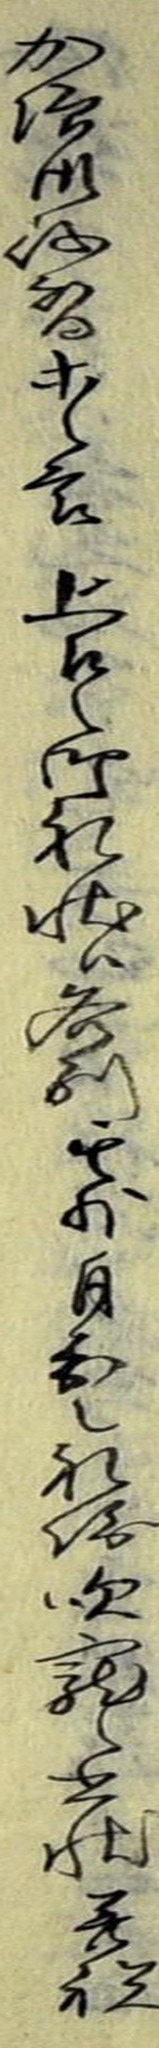加増御役替等之節上江之御礼状ハ各別其外自分之礼儀吹寵之書状并祝

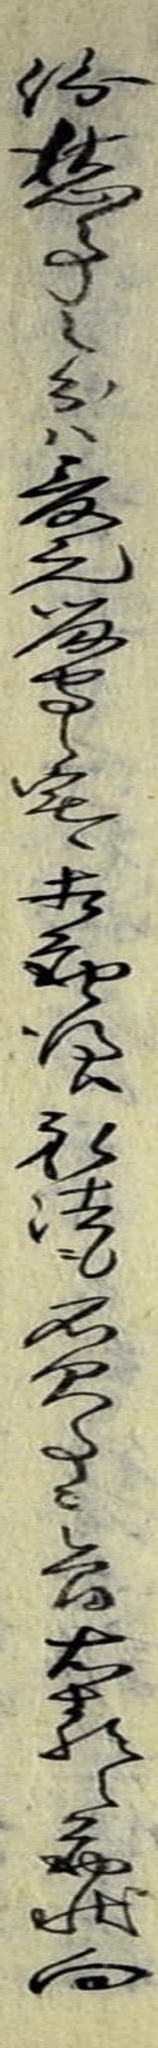儀愁事之分ハ爰元留守宅へ相勤候得ハ礼法も不欠事ニ候間右類之勤状向
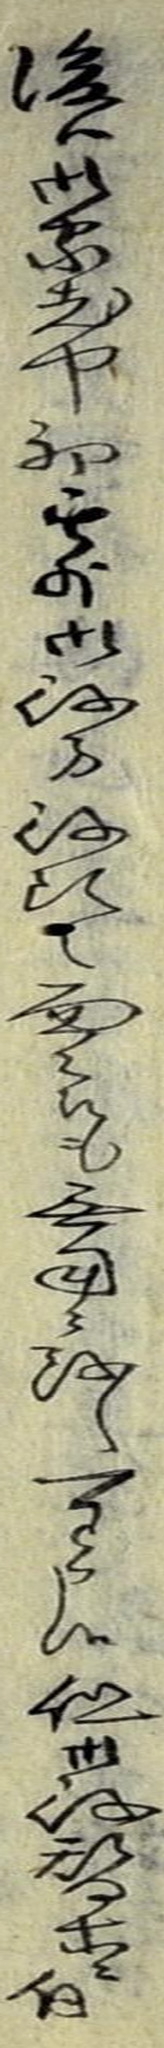後ハ御家老中初其外御役方役頭之面々江も無用ニ致し可被申候但御役替等ニ付
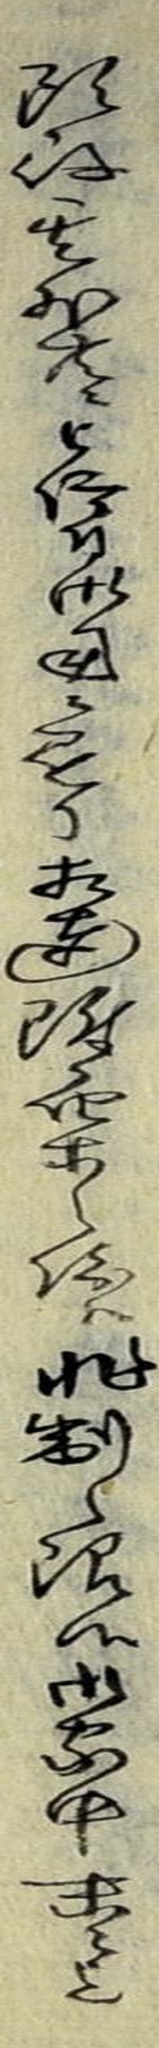頭役其外共ニ被仰付御用ニ懸り相達附届等之儀ハ非制之限候御家中末々迄
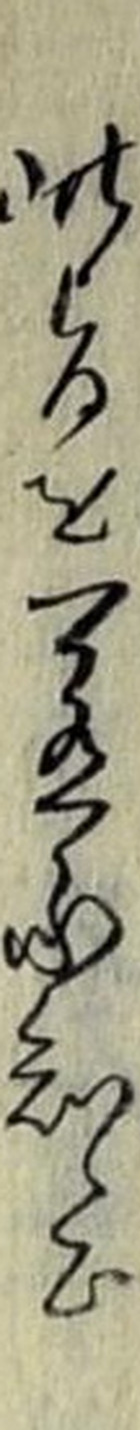此旨を可有承知候以上
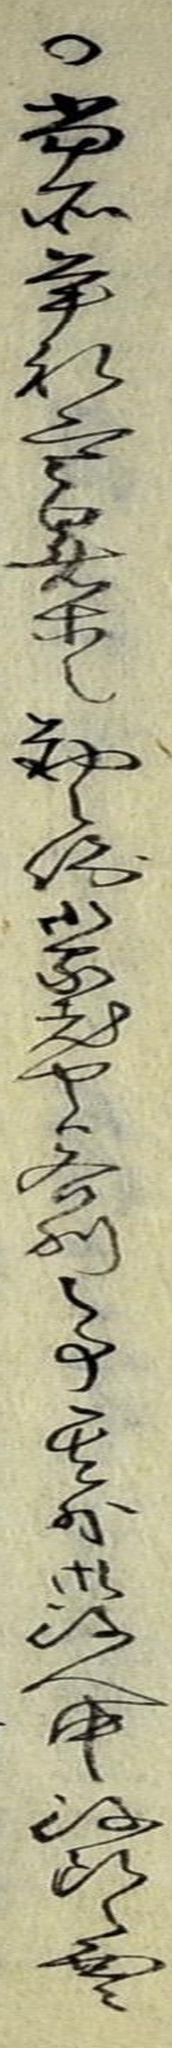〇当所年礼寒暑等之勤之儀御家老中ハ各別之事其外御役人中役頭之面々
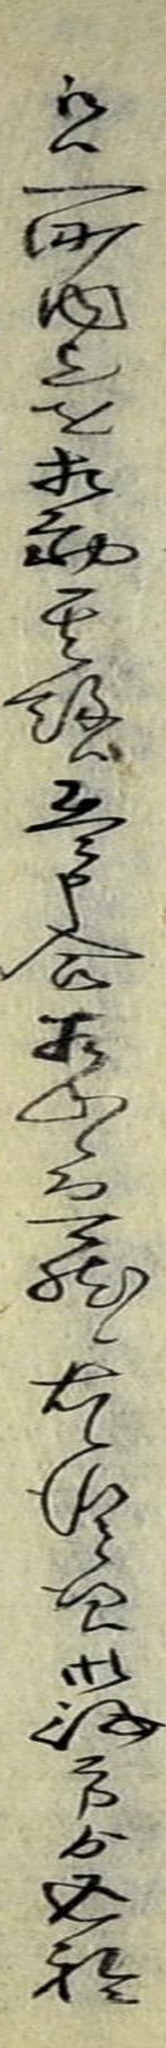江ハ一町内迄を相勤其余ハ互ニ申合相止候而可然候右之趣ニ候得ハ御役方ゟ返礼ニ
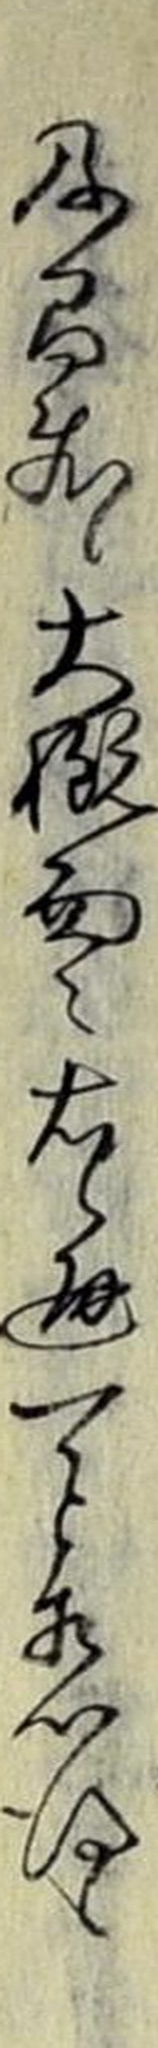及間敷候大概面々右之通可被相心得候
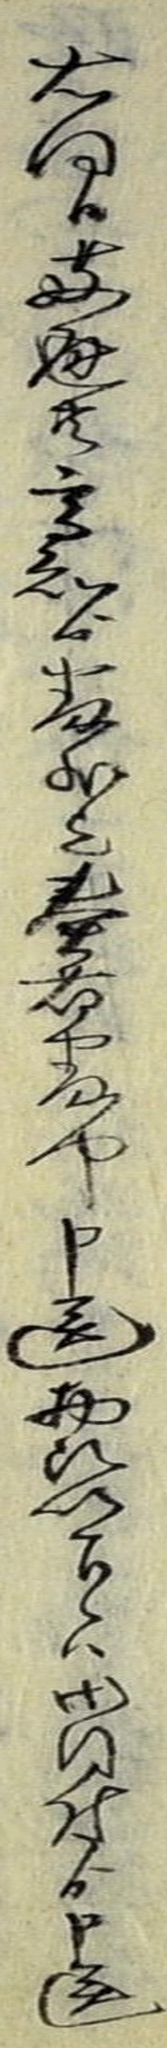右同日両通共高知ゟ番外迄奏者番中申送物頭以下ヘハ御目付ゟ申送
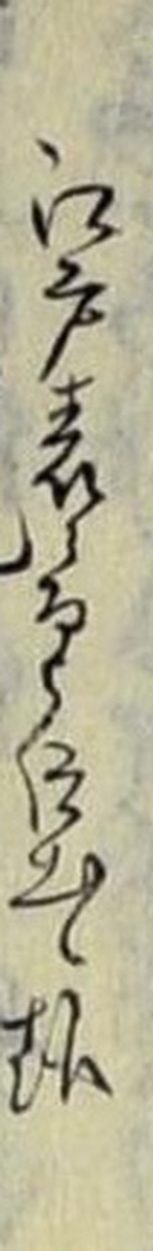江戸表ニ而被仰出候趣
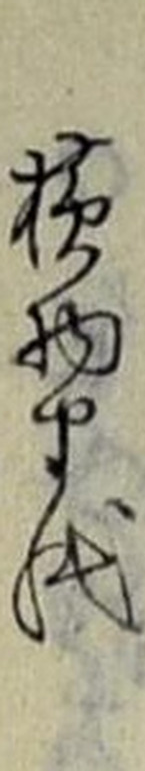横物半紙
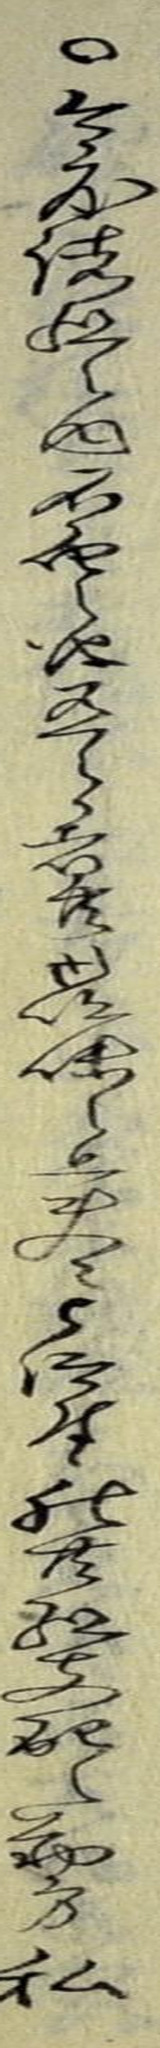〇今度諸組之内不届之儀有之候者共御吟味之上夫々被仰付候然共組支配之勤方私
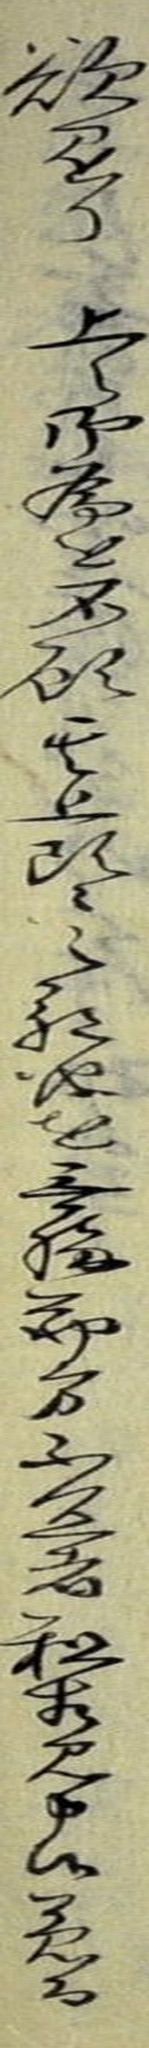欲懸り上之御為を不願其上頭々之難儀を無構勤方不宜者粗相見申候兼而
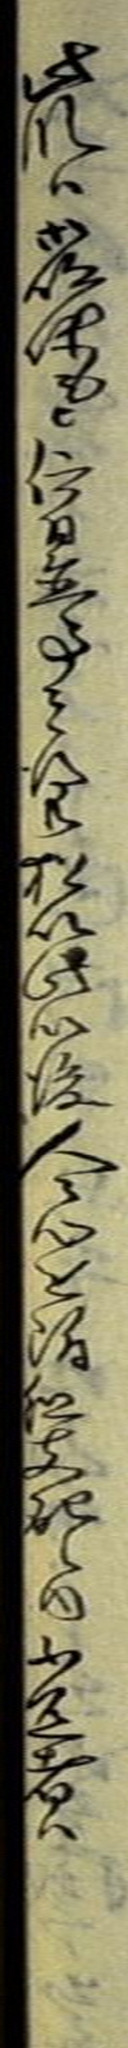此段ハ御吟味も被仰付置候事ニ候得共猶以此以後人々心を付組支配之内不宜者ハ
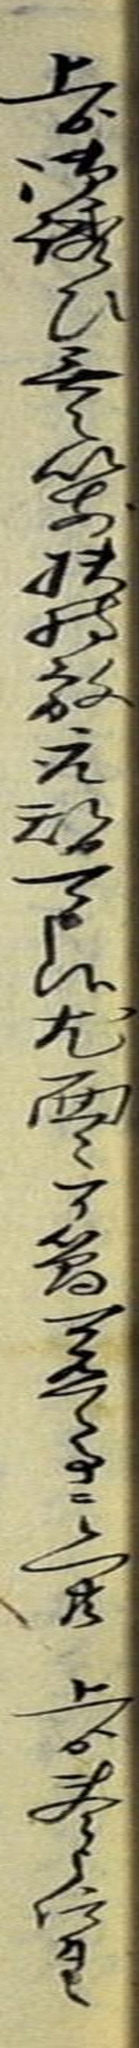上ゟ誘？ひ無之以前扶持放取替可申候尤面々了簡可有之事ニ候へ共上ゟ夫々被仰付之
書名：命令之部 一
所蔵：福井県文書館 Fukui Prefectural Archives
